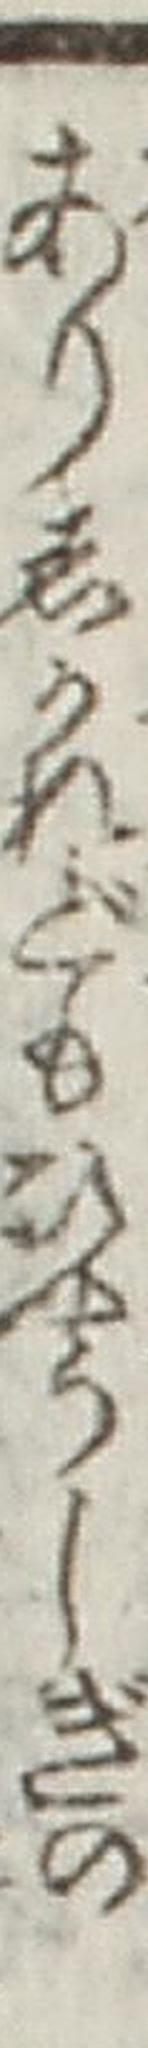ありしかれどもひやうしぎの
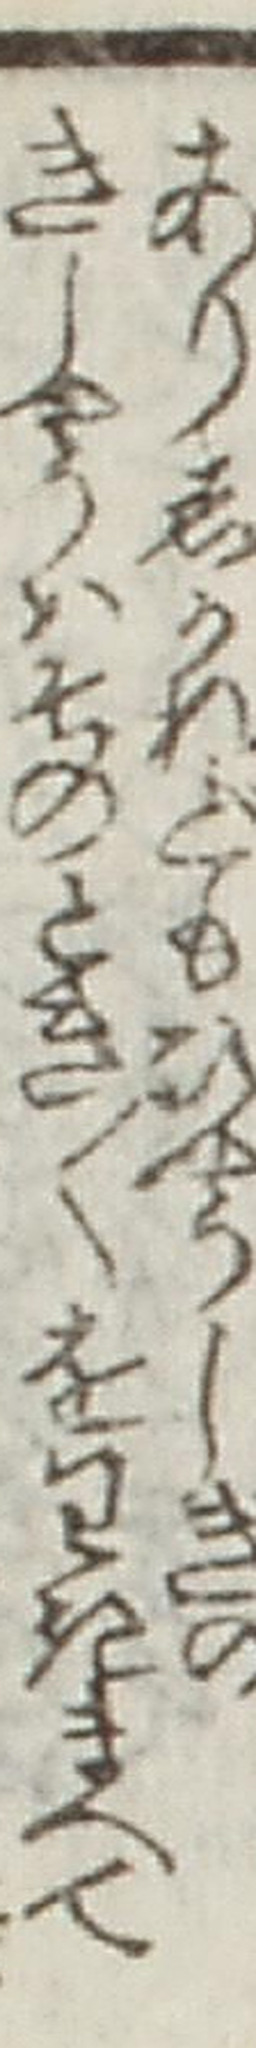きしやうはちのとき〳〵をわきまへて
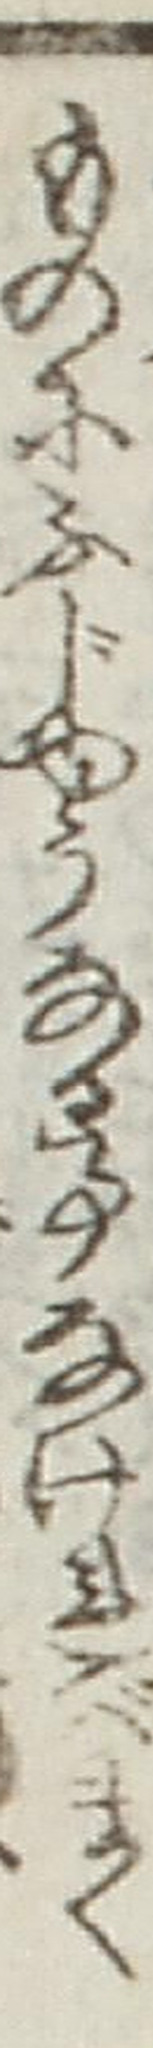ものにふじゆうなる事なければまく
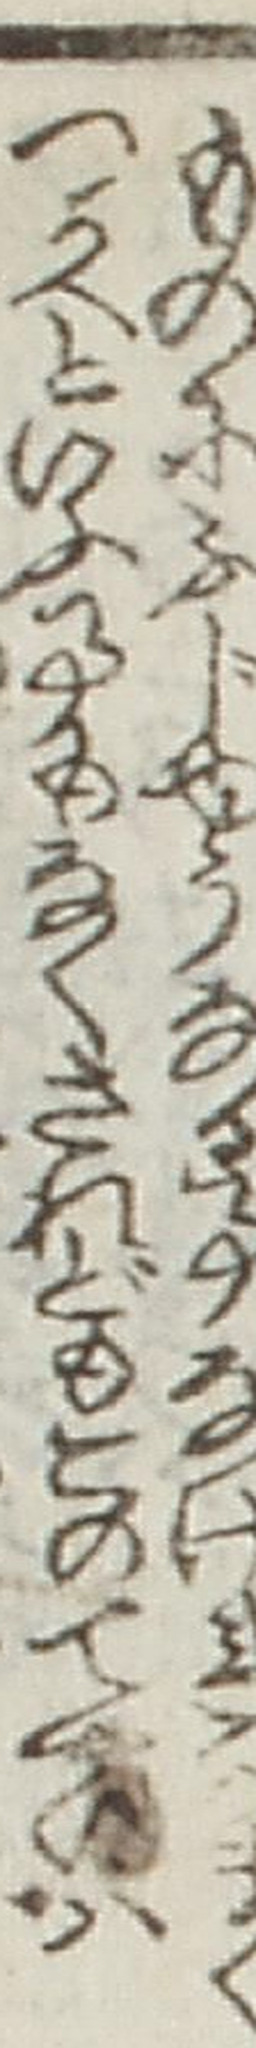つかへといふ事もなくされどもこのてく？い？お？
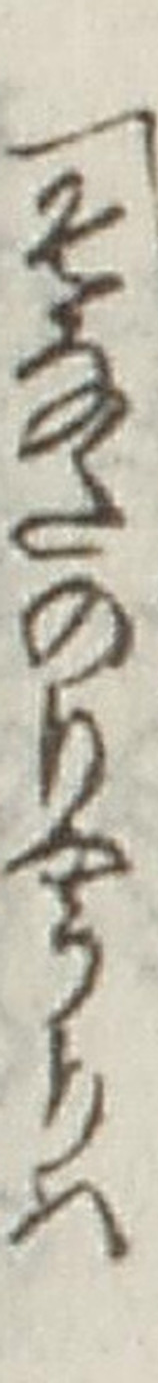〽そなたのりやうりは
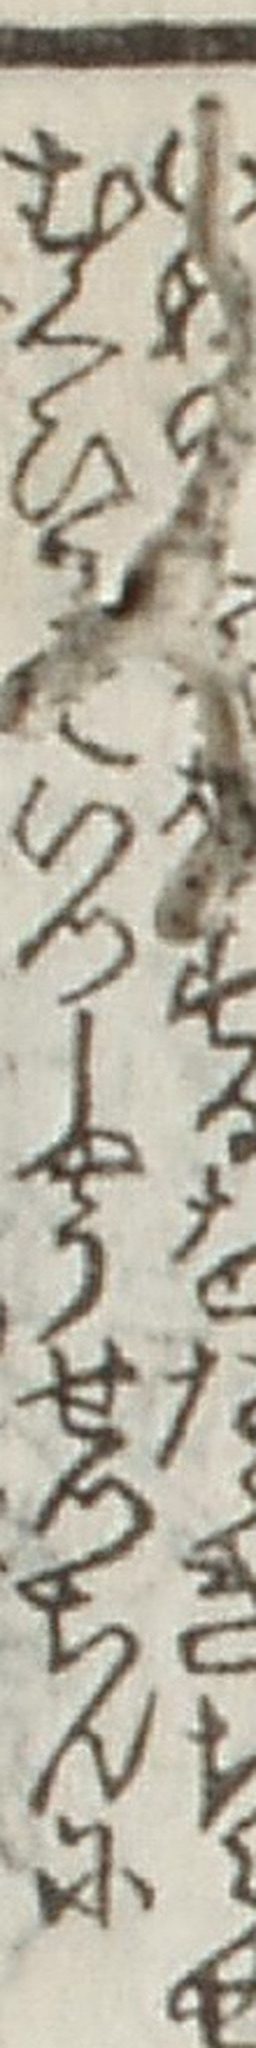むくひにていつしやうせつちんに
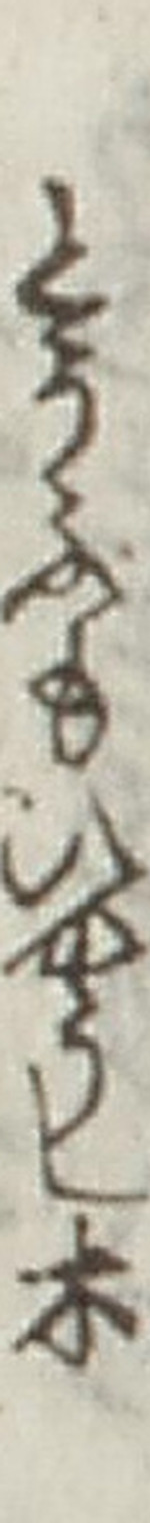とうふもひやうし木
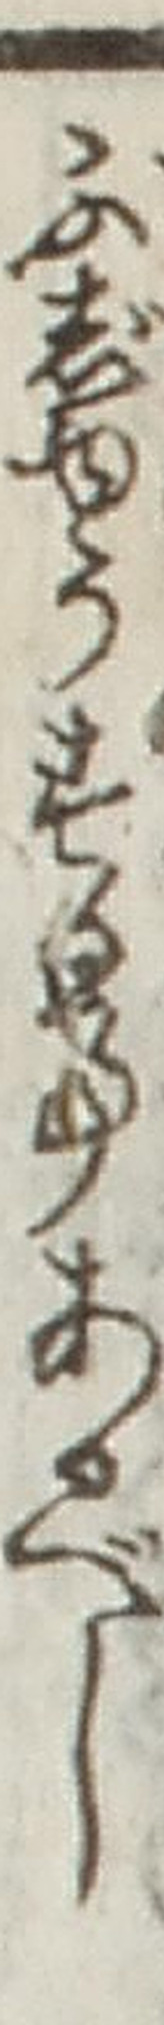ふじゆうする事あるべし
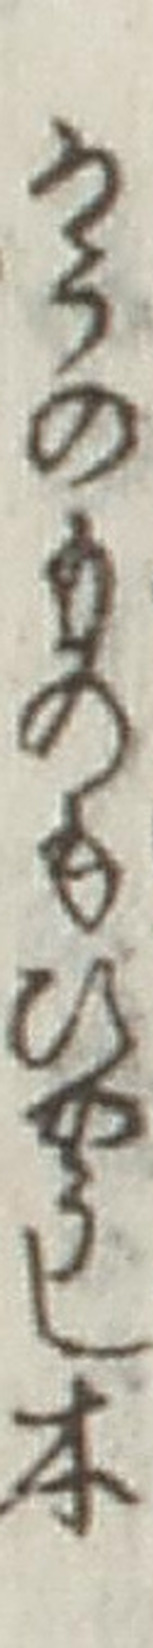かうのものもひやうし木
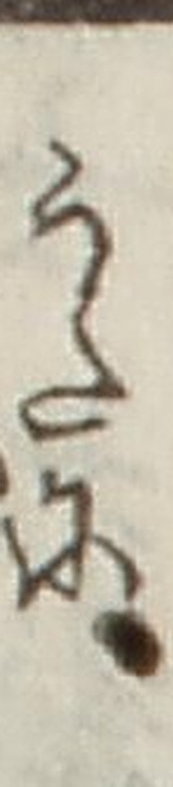うたに
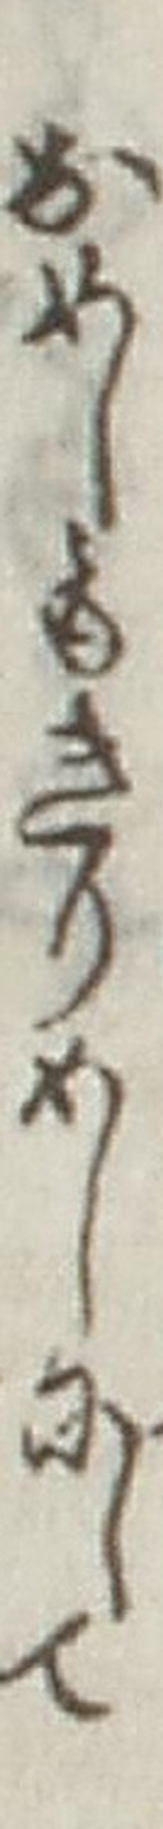おめしもきりめしにして
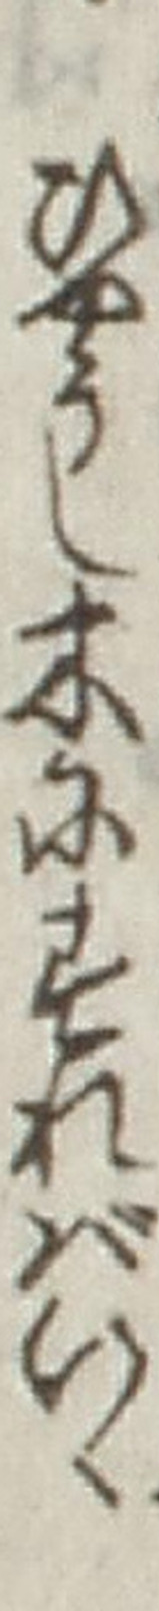ひやうし木にすればいゝ
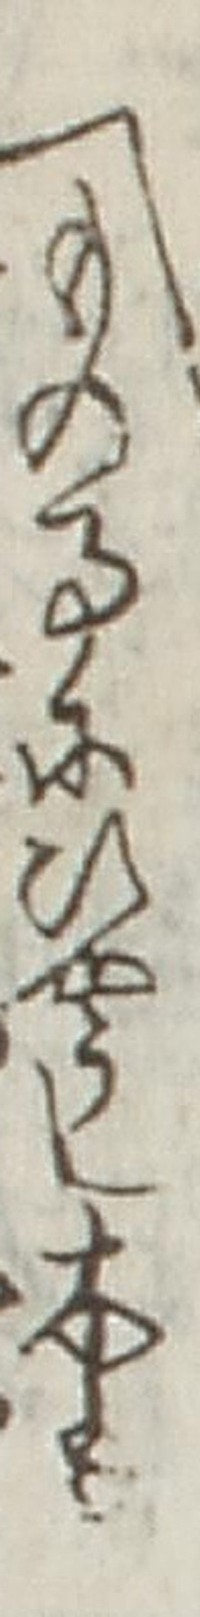〽もの事にひやうし木も
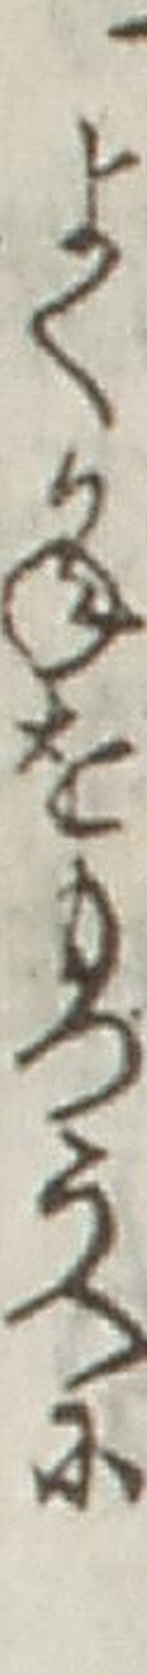よくかねをもつうへに
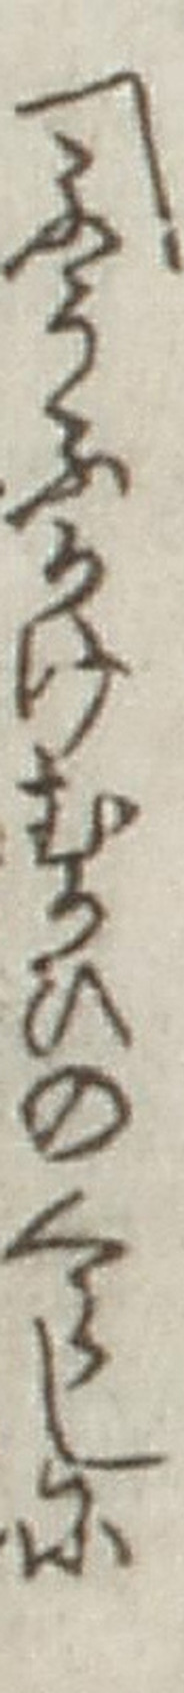〽ふうふかけむかひのくらしに
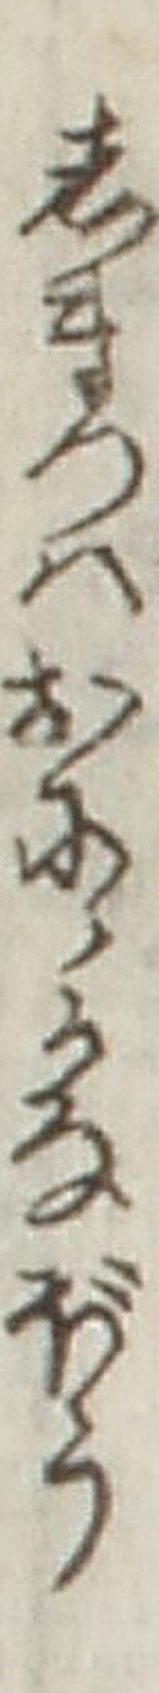しまつはおにゝかなぼう
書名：三世相出雲當座帳　上下冊
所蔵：東京大学地震研究所図書室 Earthquake Research Institute Library, The University of Tokyo, JAPAN
